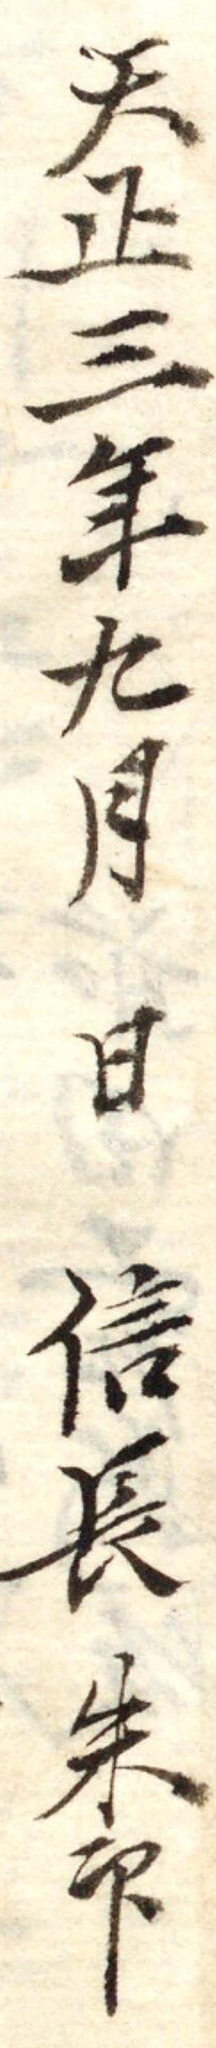天正三年九月日信長朱印
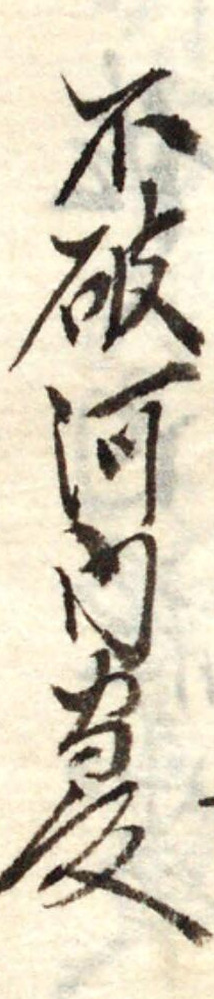不破河内守殿

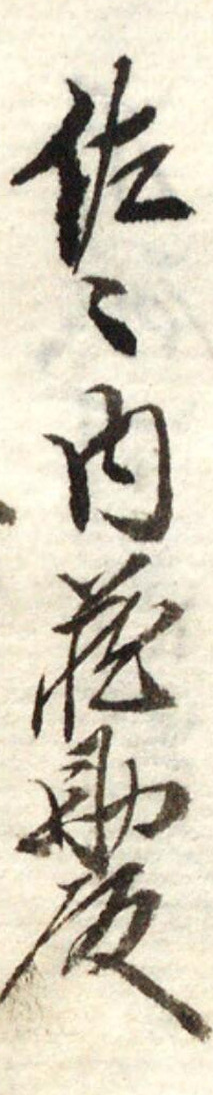佐々内蔵助殿
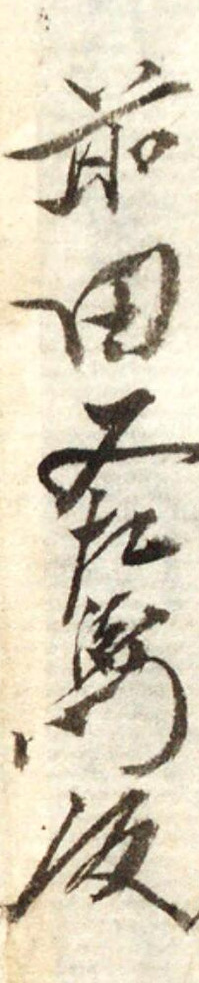前田又左衛門殿
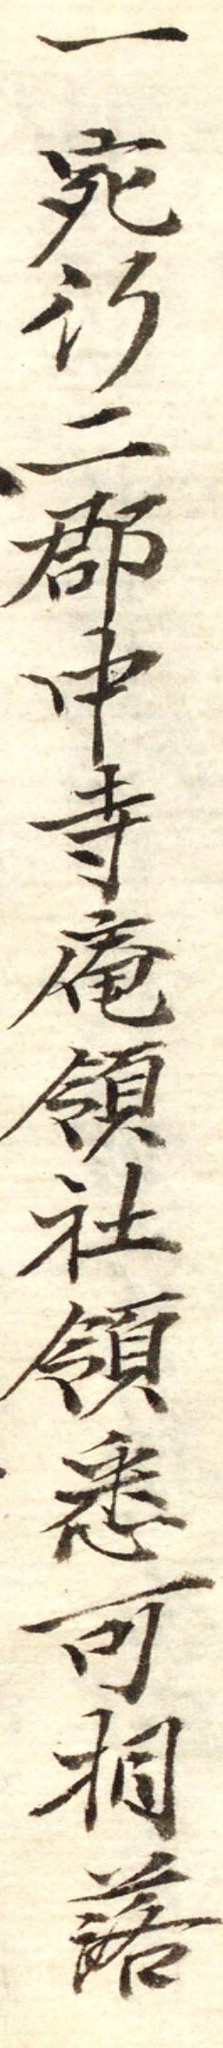一宛行二郡中寺庵領社領悉可相落
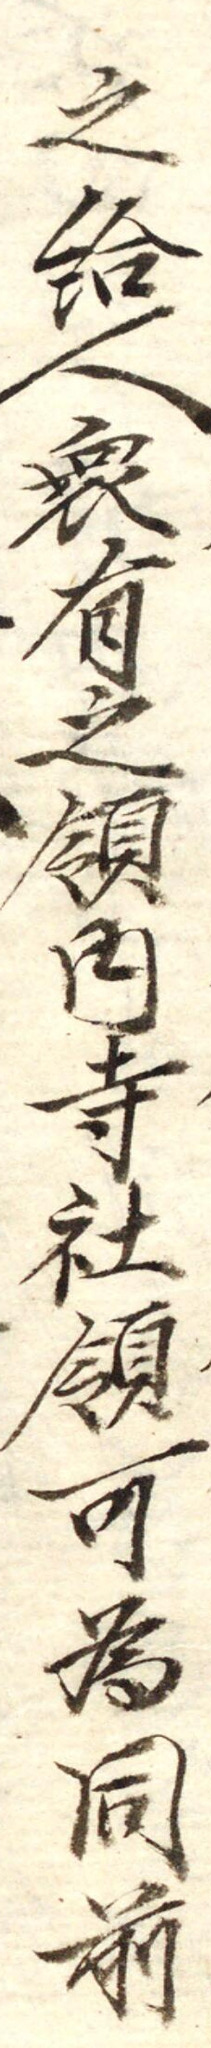之給人衆有之領内寺社領可為同前
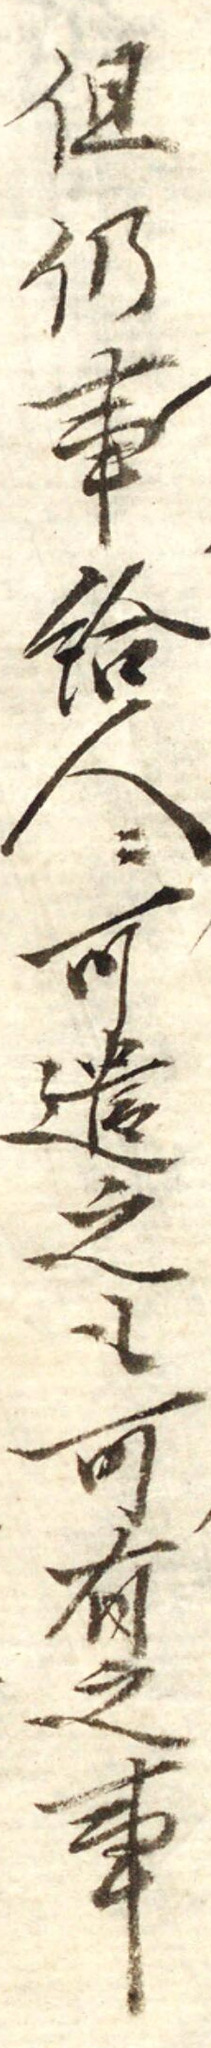但仍事給人に可遣之も可有之事
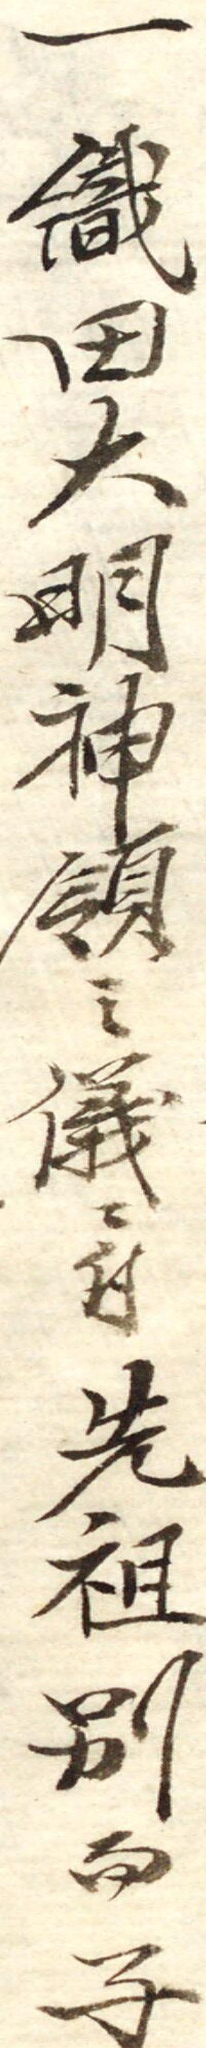一織田大明神領之儀に付先祖別而子
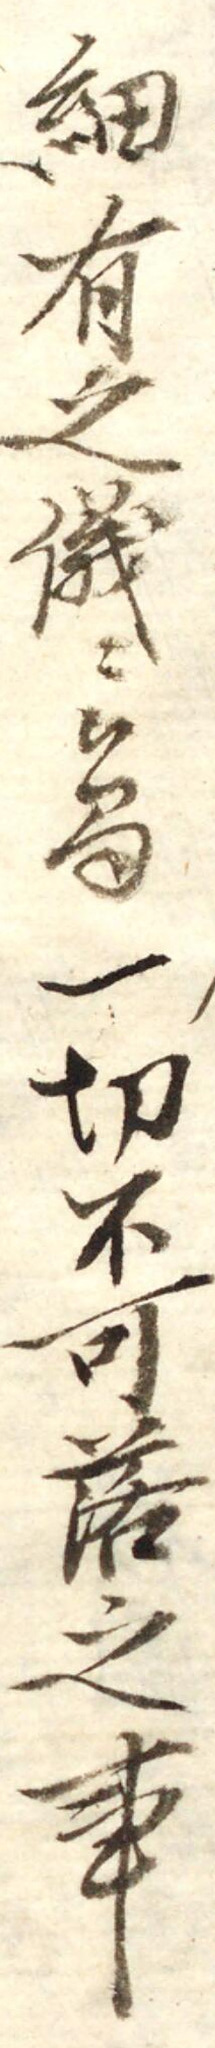細有之儀に候間一切不可落之事
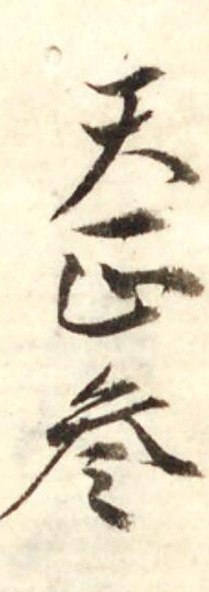天正参
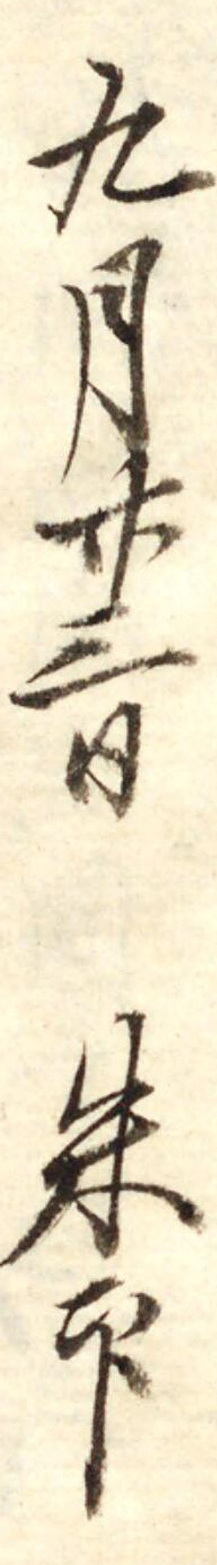九月廿三日朱印
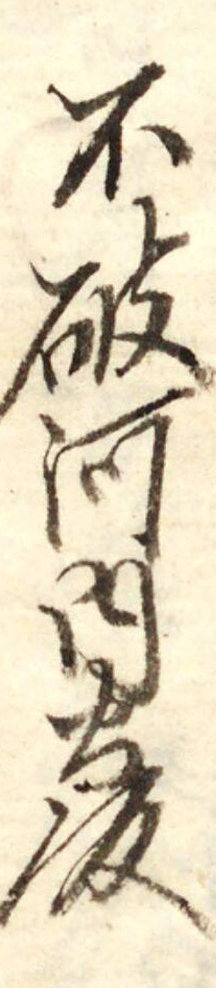不破河内守殿
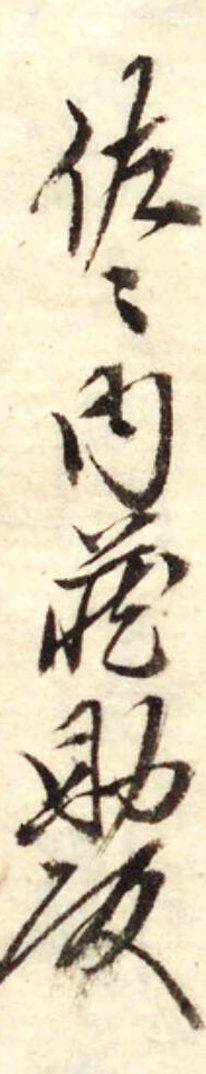佐々内蔵助殿
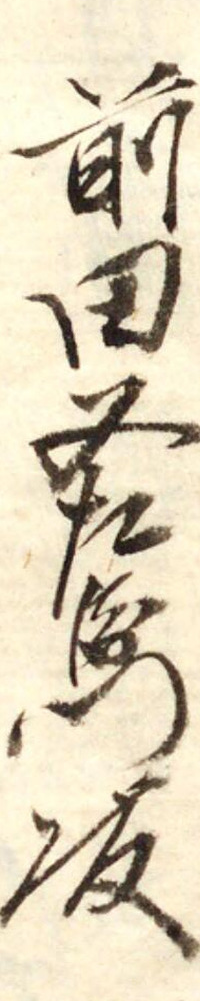前田又左衛門殿
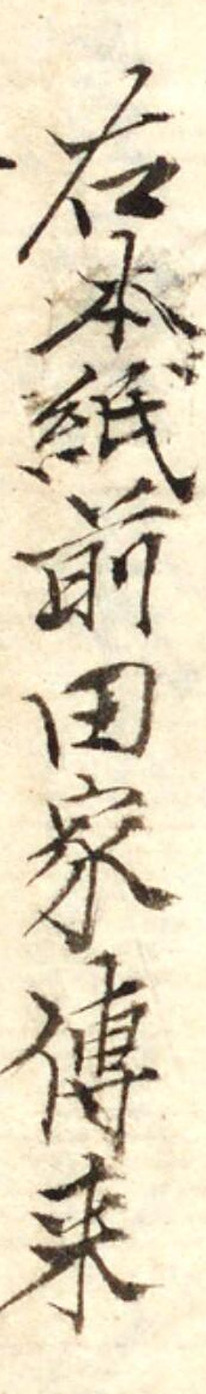右本紙前田家伝来
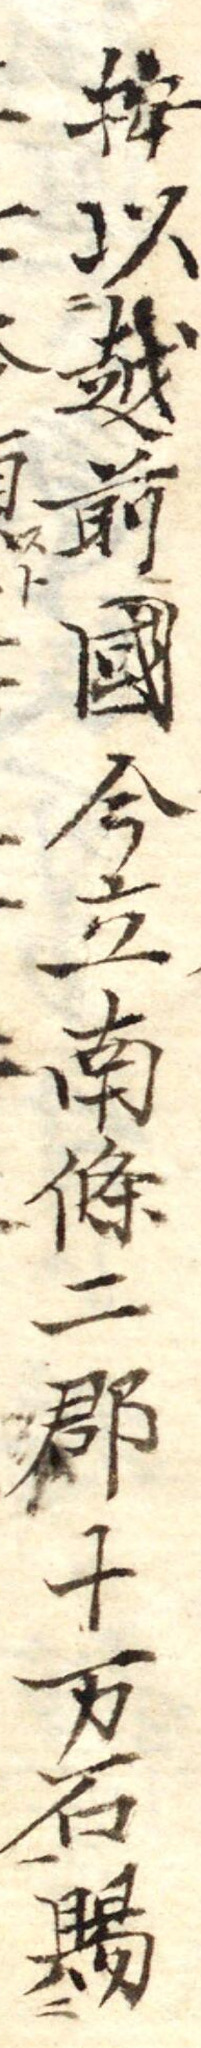按以越善国今立南條二郡十万石賜
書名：前田家封国証書集録
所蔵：Ishikawa Prefectural Library
